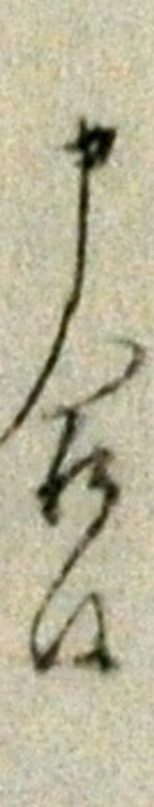申合候
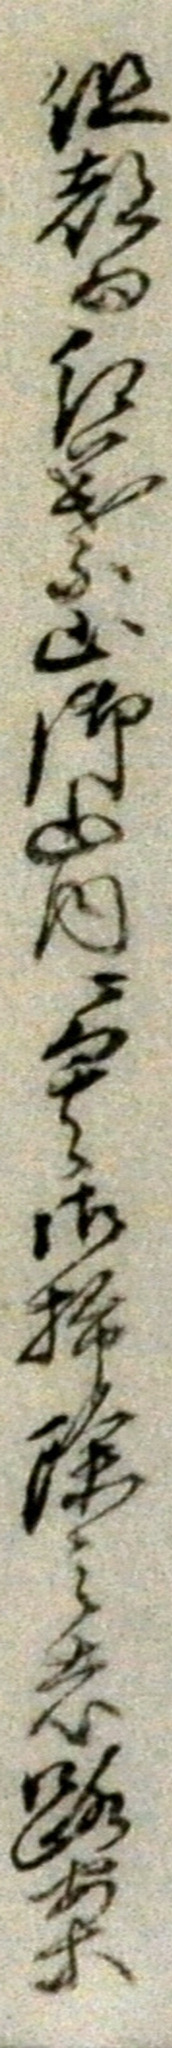但都而紅葉山御山内ニ而は御掃除之者路案
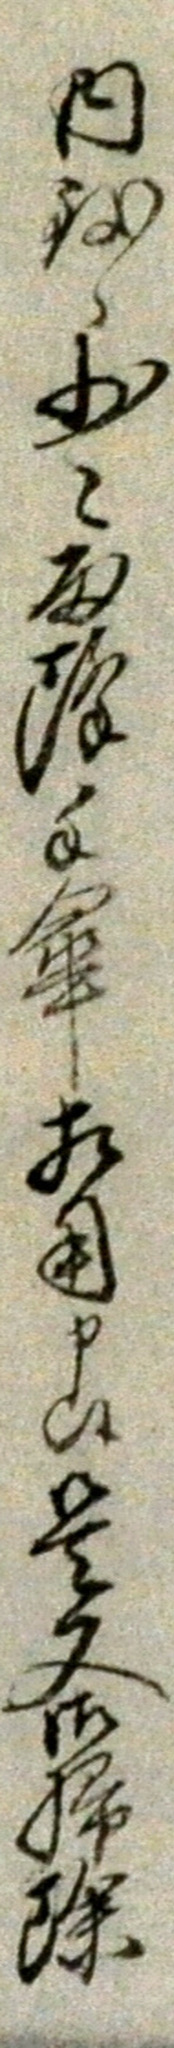内致候少々雨除手傘相用申候是又御掃除
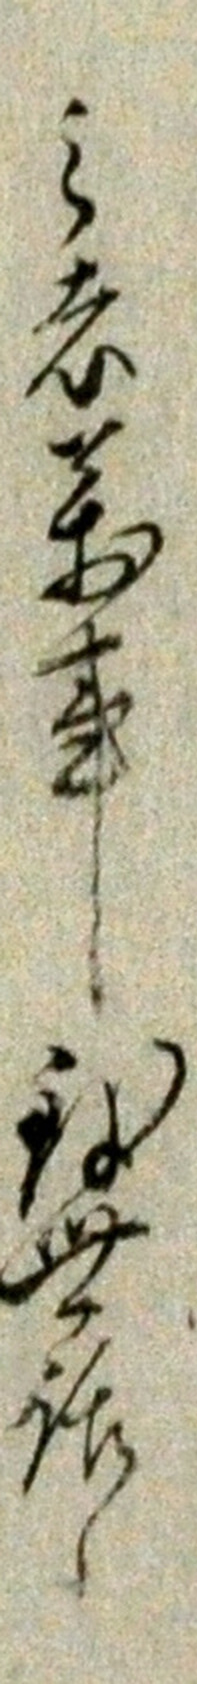之者万事致世話候
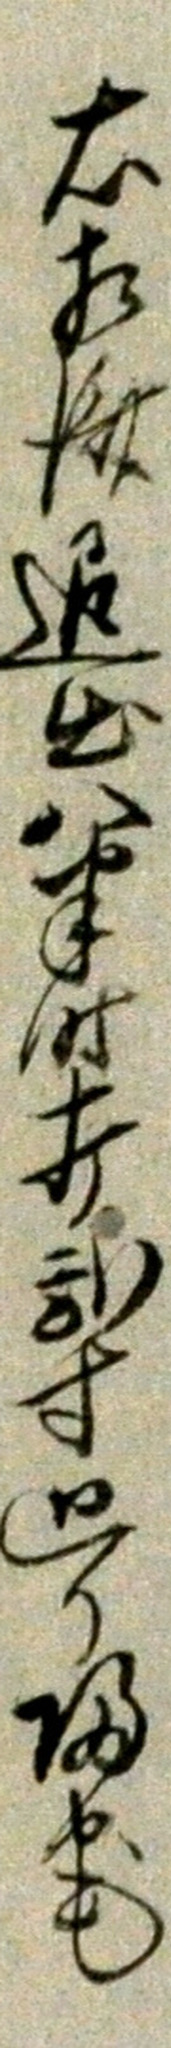右相済退出八半時打弐寸廻り帰宅
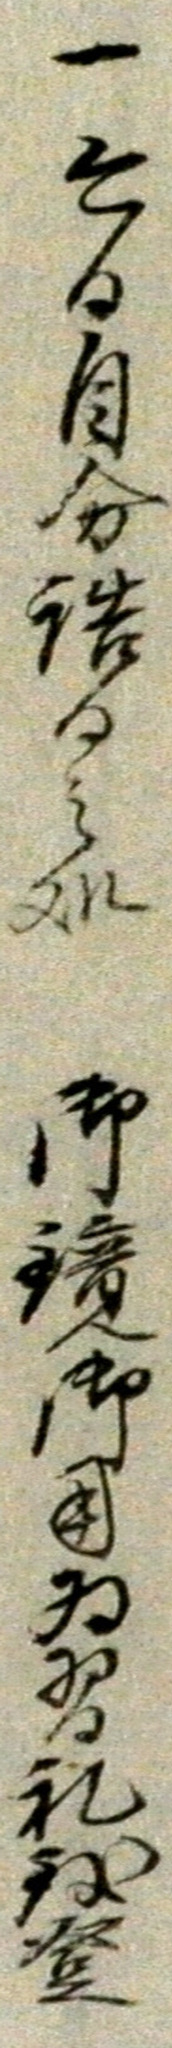一今日自分詰日之処御鏡御用為習礼致登
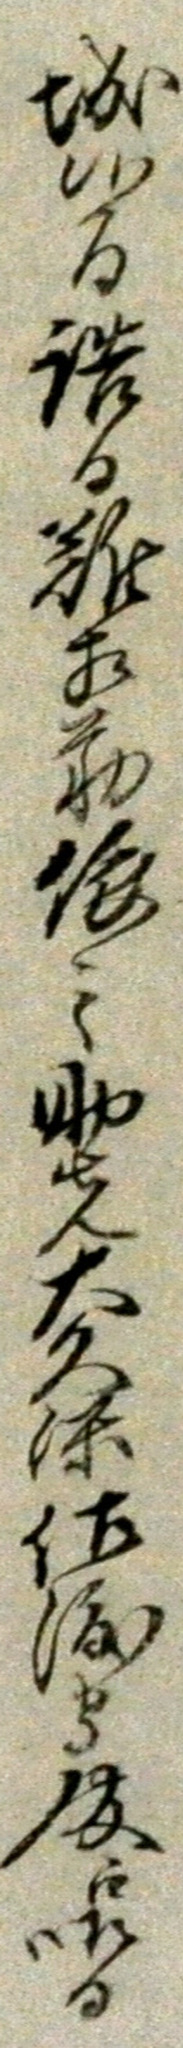城候間詰日難相勤依之助先大久保佐渡守殿え昨日
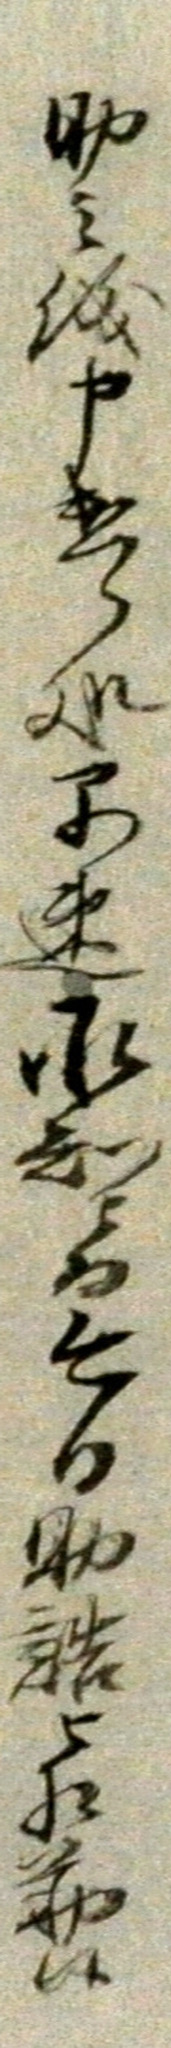助之儀申遣候処早速承知ニ而今日助詰被相勤候
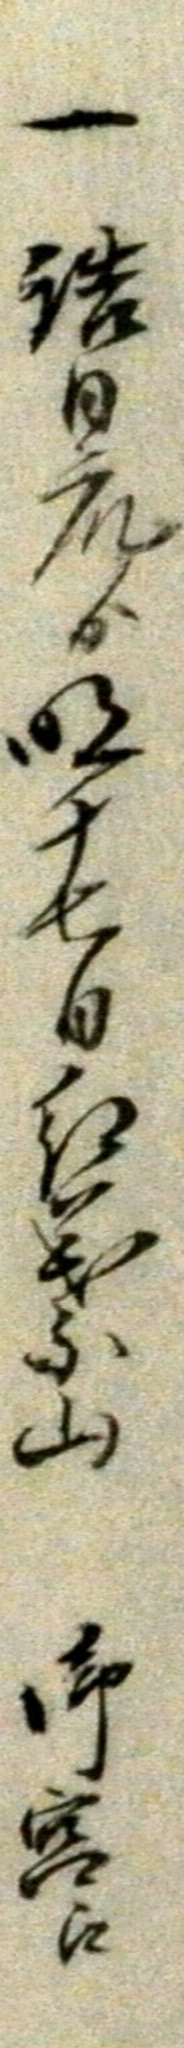一詰日衆ゟ明十七日紅葉山御宮え
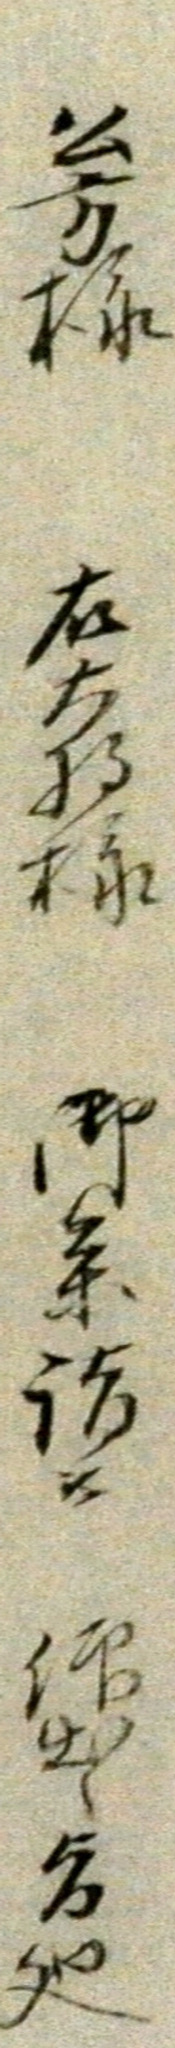公方様右大将様御参詣被仰出候旨廻
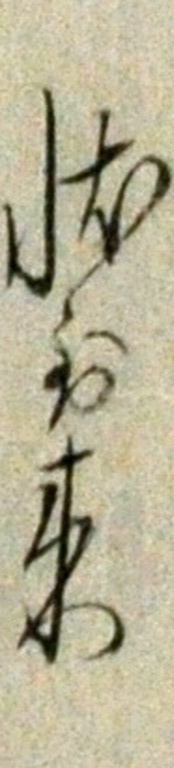状到来
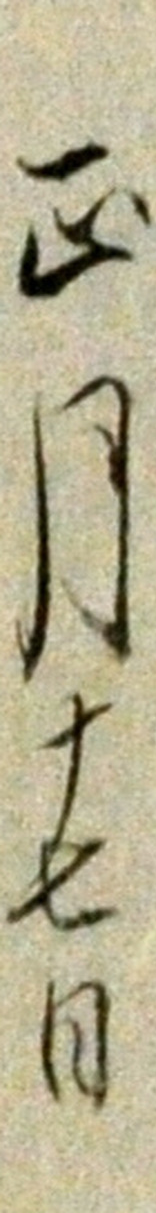正月十七日
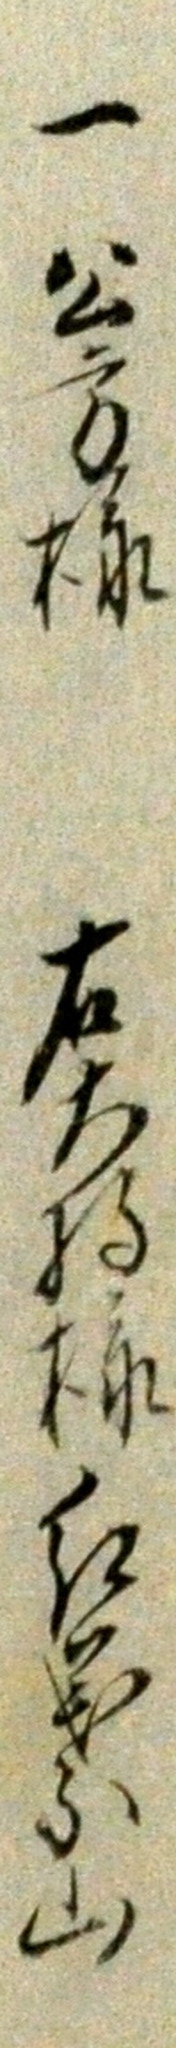一公方様右大将様紅葉山
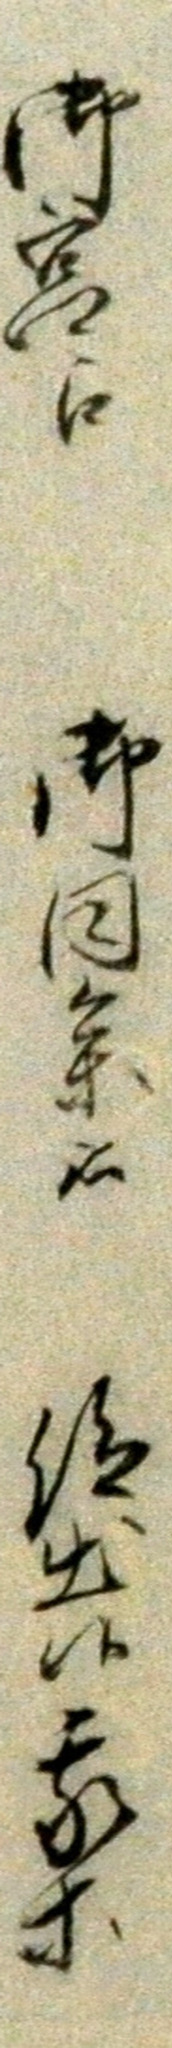御宮え御同参被仰出候我等
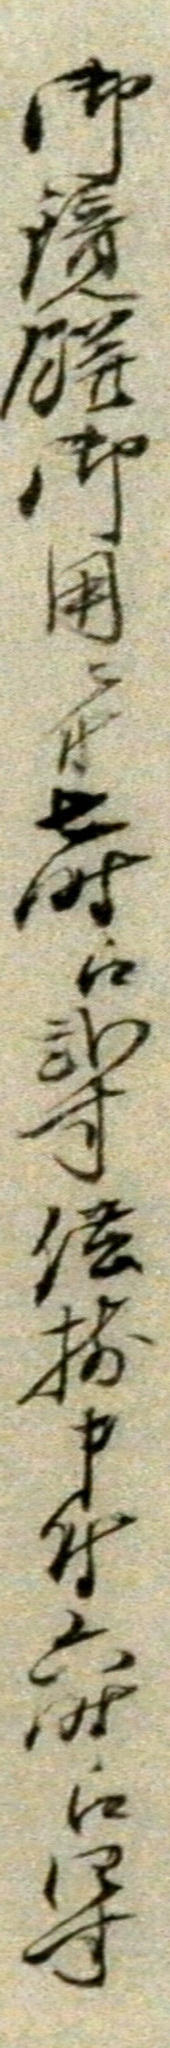御鏡餅御用ニ付七時え弐寸供揃申付六時え四寸
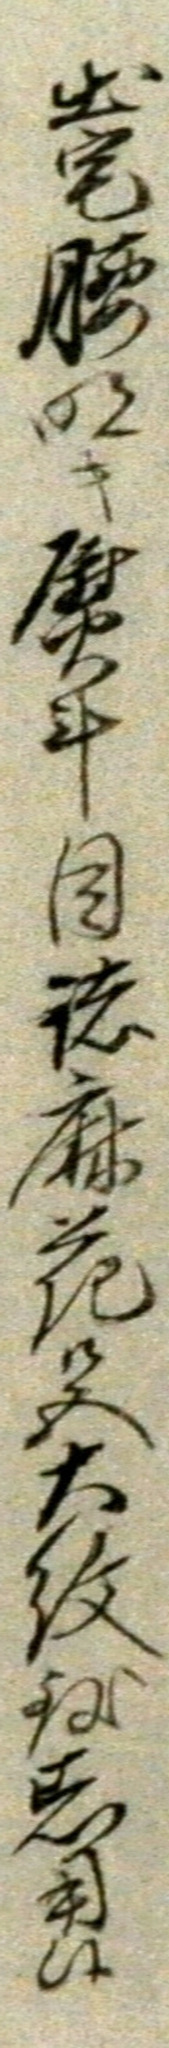出宅腰明キ熨斗目諸麻花色大紋致着用候
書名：御鏡餅御用留（写）
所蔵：伊那市立高遠町図書館・合同会社AMANE
